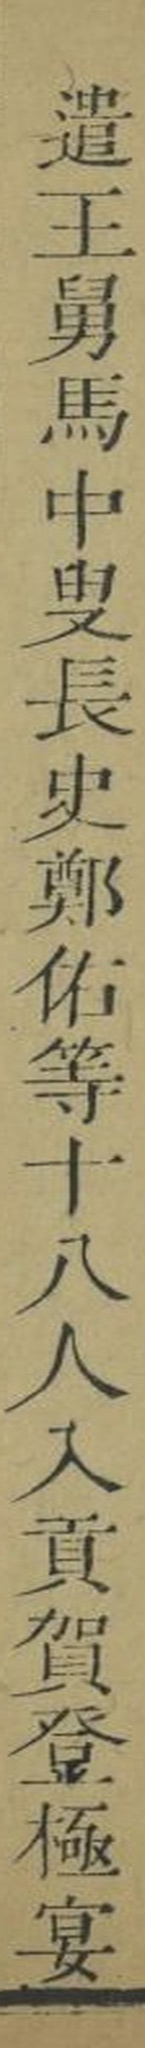遣王舅馬中叟長史鄭佑等十八人入貢賀登極宴
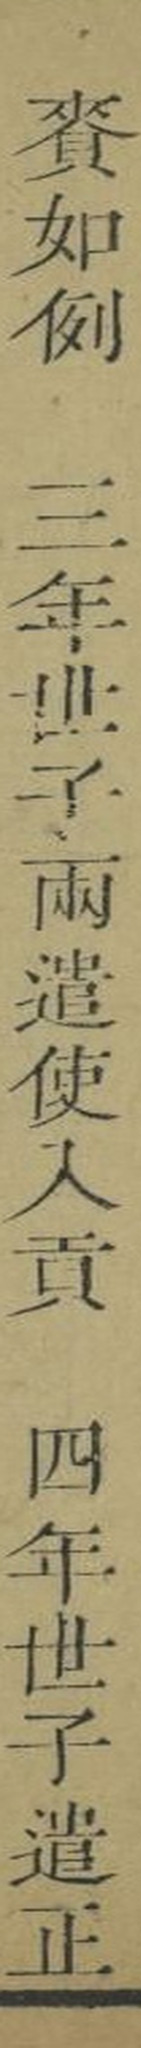賚如例三年世子両遣使入貢四年世子遣正
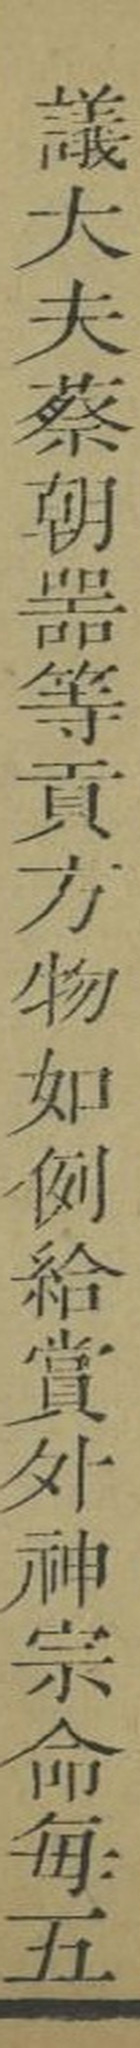議大夫蔡朝器等貢方物如例給賞外神宗命毎五
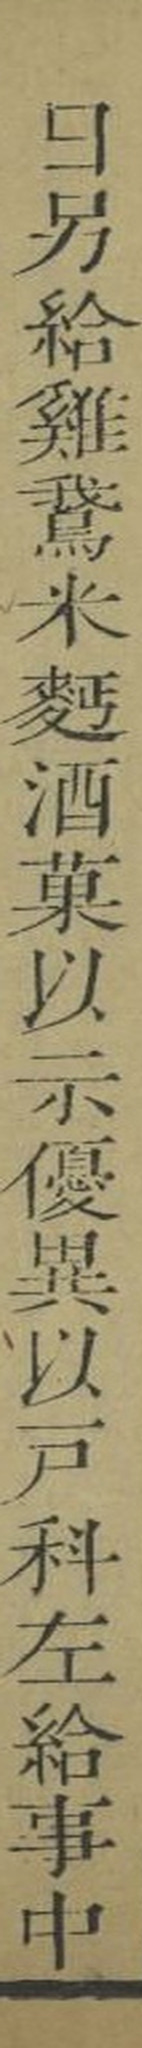日另給鶏鵞米麪酒菓以示優異以戸科左給事中
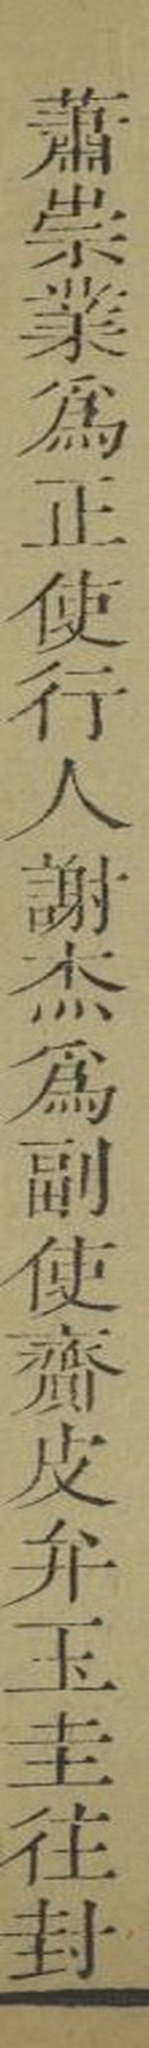蕭崇業為正使行人謝杰為副使齎皮弁玉圭往封
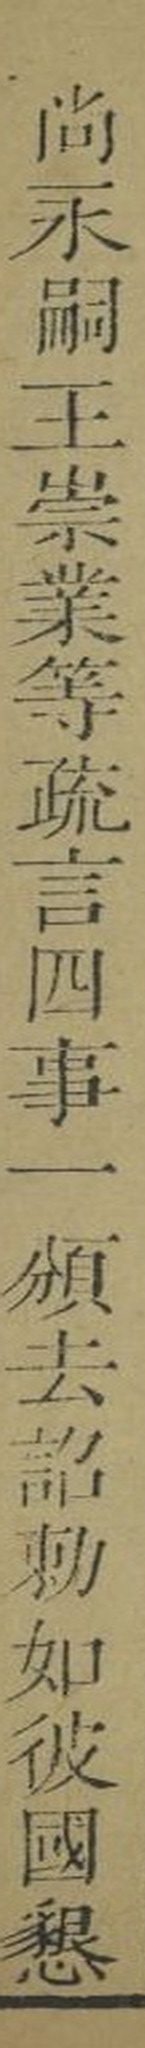尚永嗣王崇業等疏言四事一頒去詔勅如彼国懇
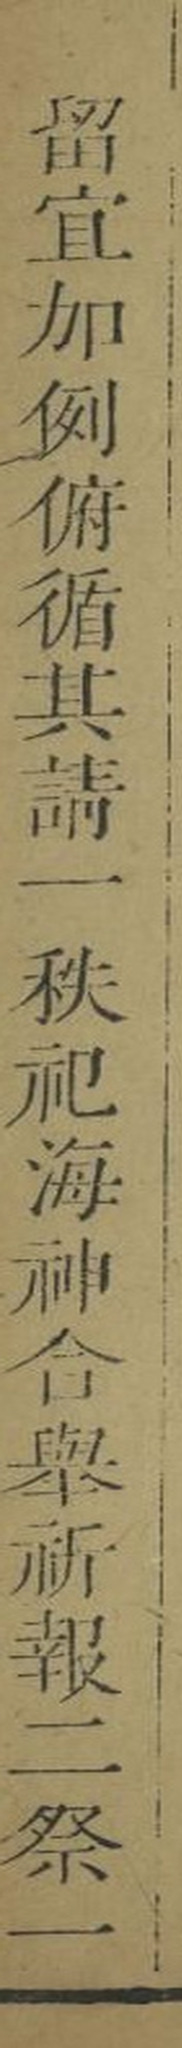留宜加例俯循其請一秩祀海神合挙祈報二祭一

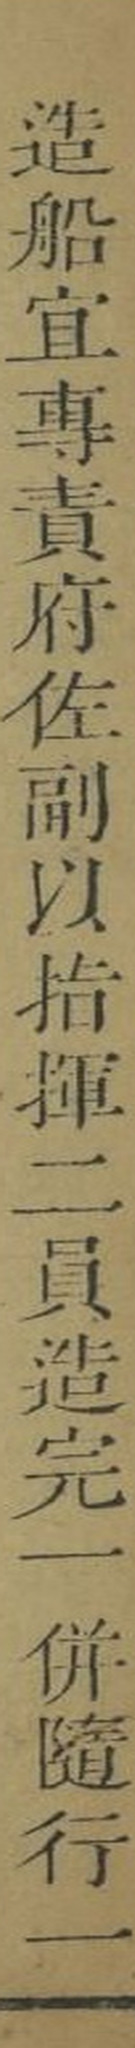造船宜専責府佐副以指揮二員造完一併随行一
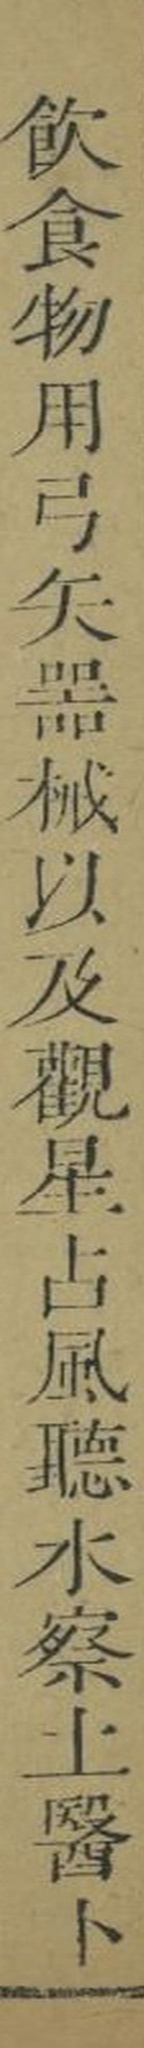飲食物用弓矢器械以及観星占風聴水察土医卜
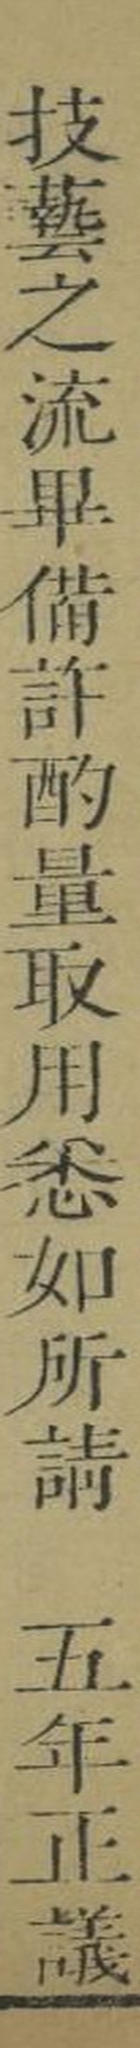技芸之流畢備許酌量取用悉如所請五年正議
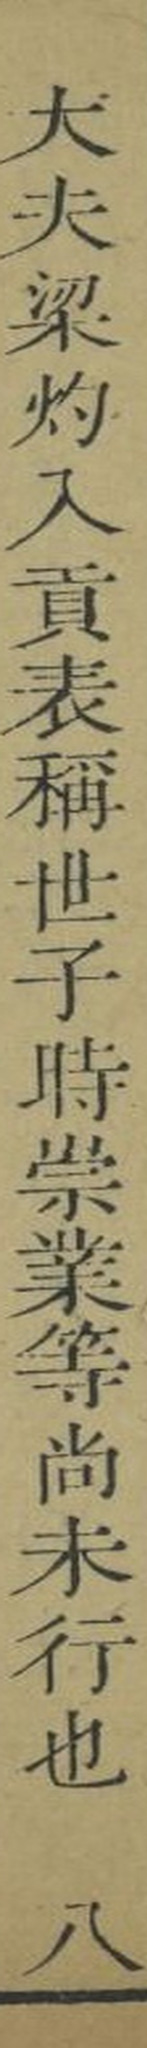大夫梁灼入貢表称世子時崇業等尚未行也八
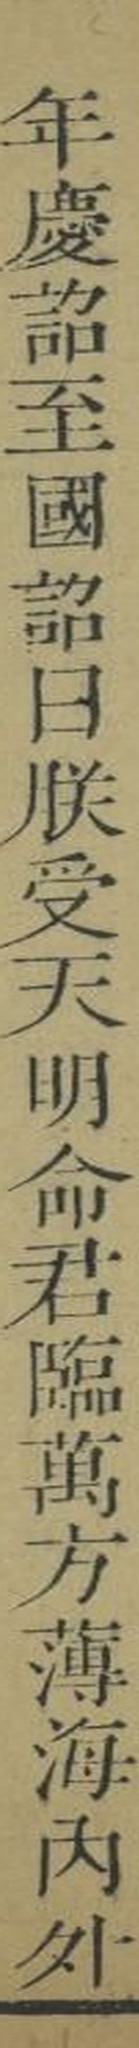年慶詔至国詔曰朕受天明命君臨万方薄海内外
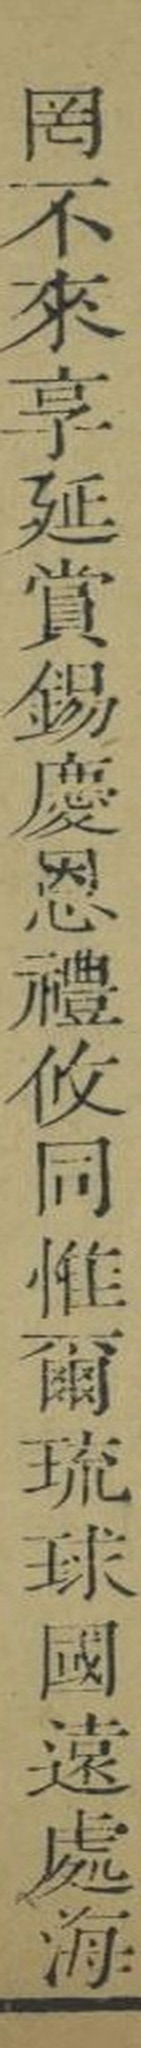罔不来享延賞錫慶恩礼攸同惟爾琉球国遠処海
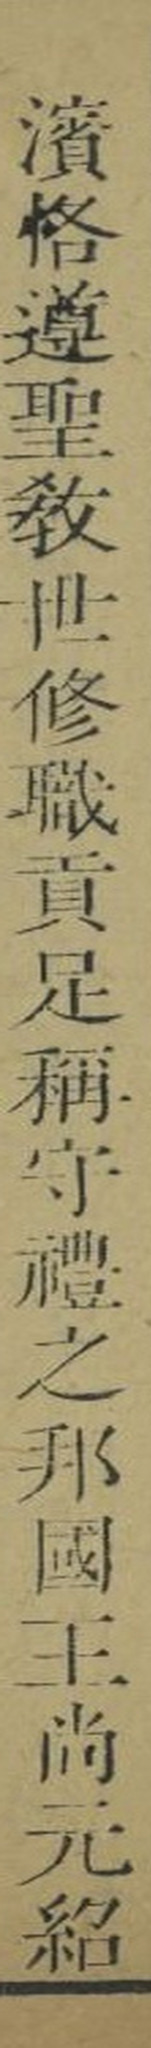浜恪遵聖教世修職貢足称守礼之邦国王尚元紹
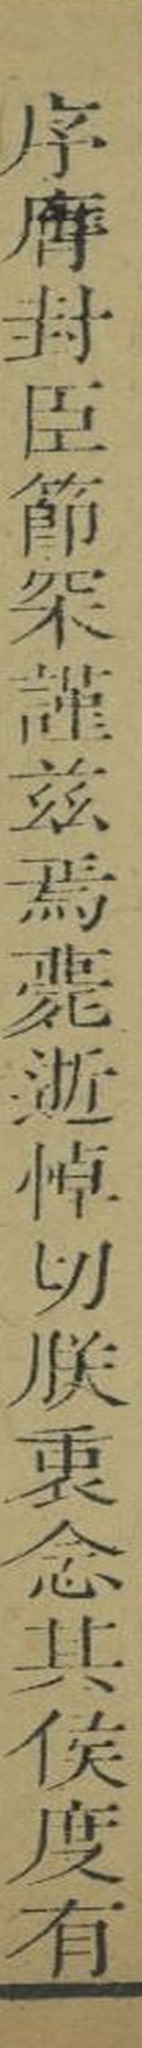序膺封臣節罙謹茲焉薨逝悼切朕衷念其侯度有
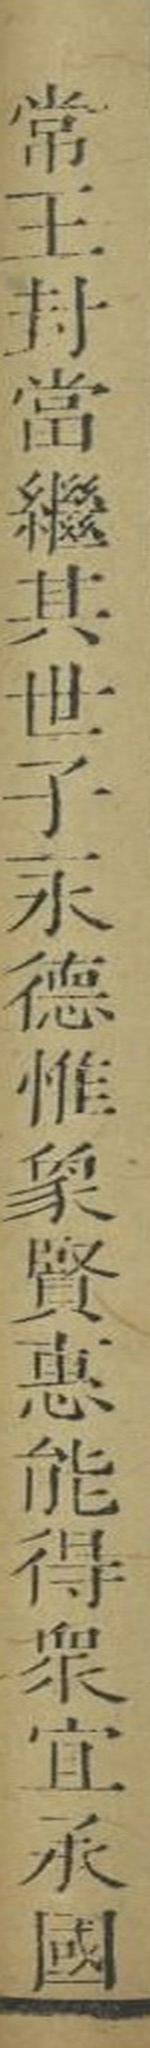常王封当継其世子永徳惟象賢恵能得衆宜承国
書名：中山伝信録 巻三
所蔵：University of the Ryukyus Library
